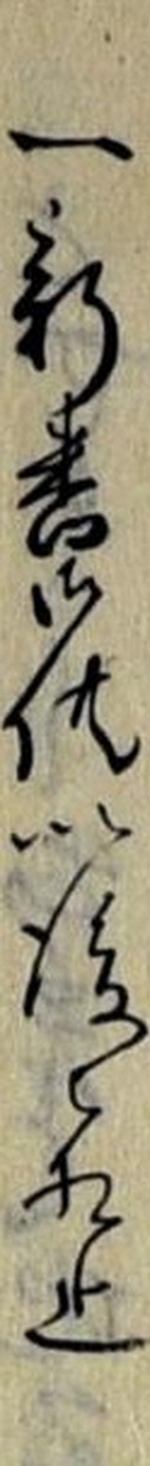一新番御供以後被相止
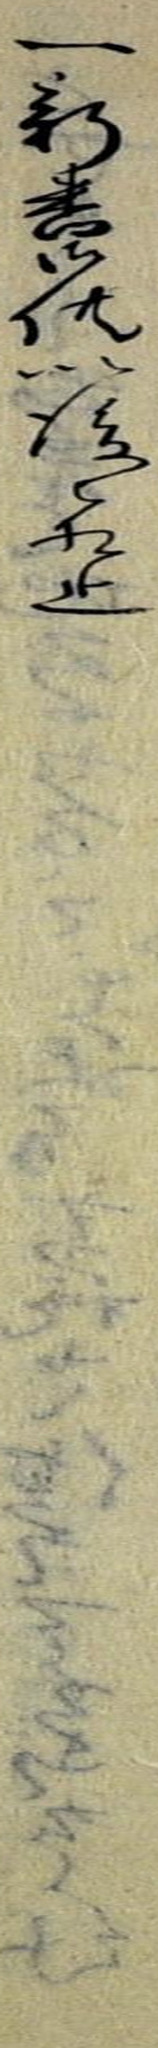一新番御供以後被相止
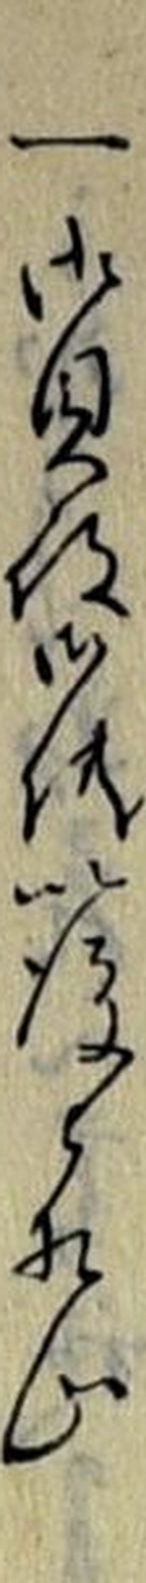一御貝役御供以後被相止
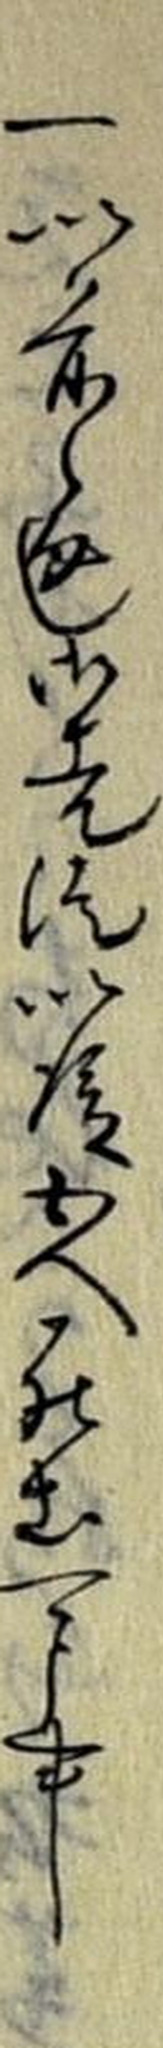一以前之通御先徒以後五人罷出可申事
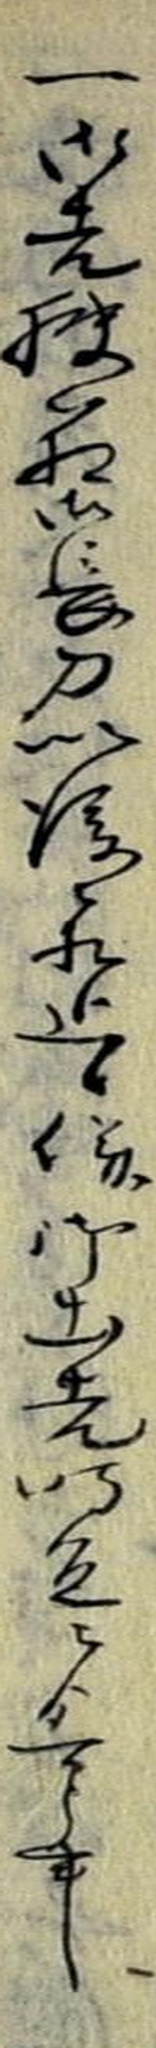一御先挟箱御長刀以後被相止候併御出先時宜ニゟ可申事
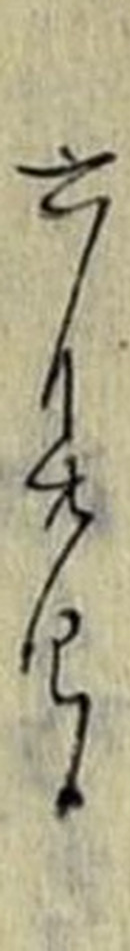六月廿四日
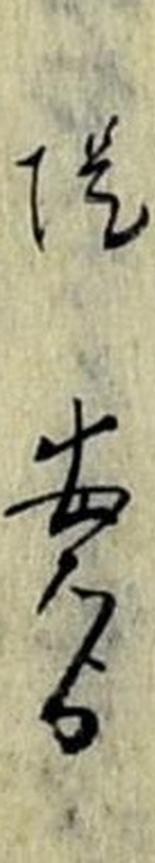堤安右衛門
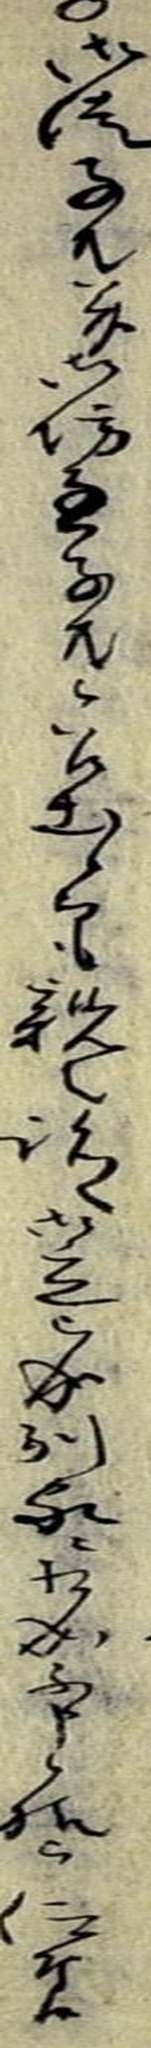一御徒子共并御坊主子共被召出候而も親之跡へ御立被成別家ニ相成不申候様被仰付候
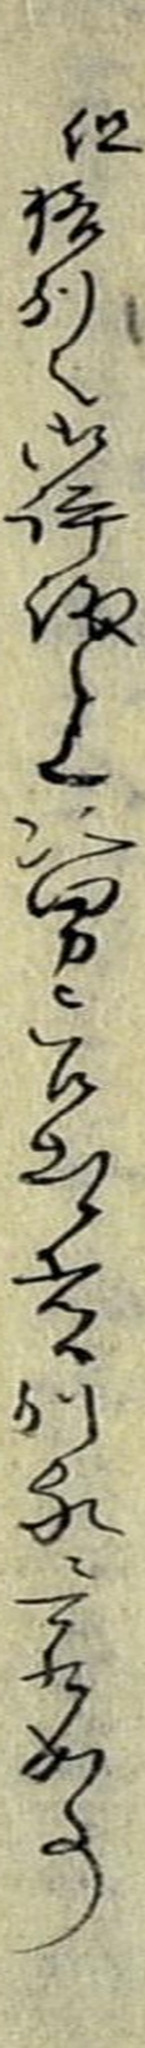但格別之御評議之上次男被召出候者ハ別家ニ可相成事
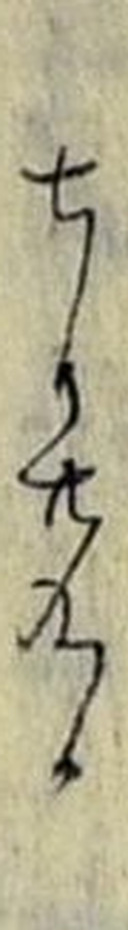七月廿九日
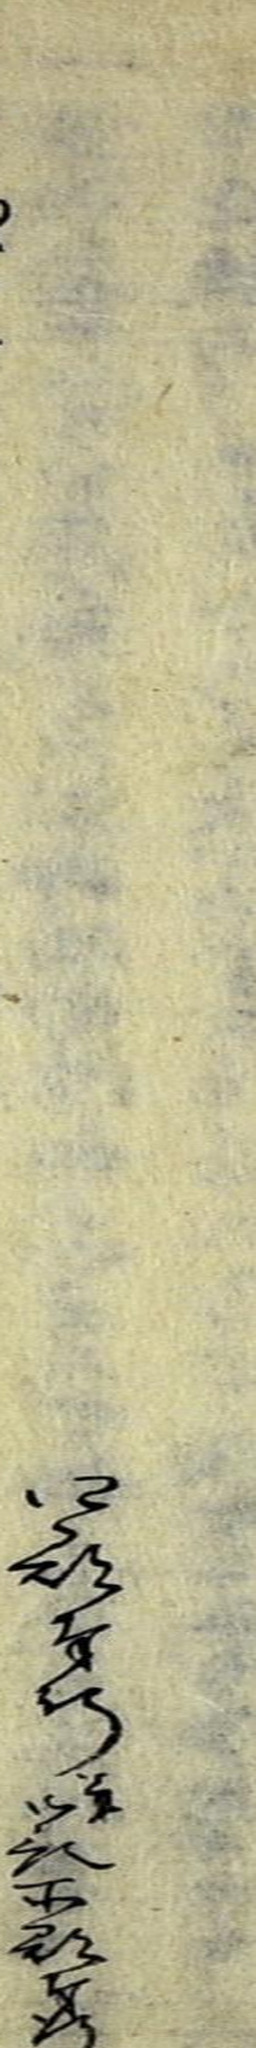四郡奉行并御預所郡奉行へ
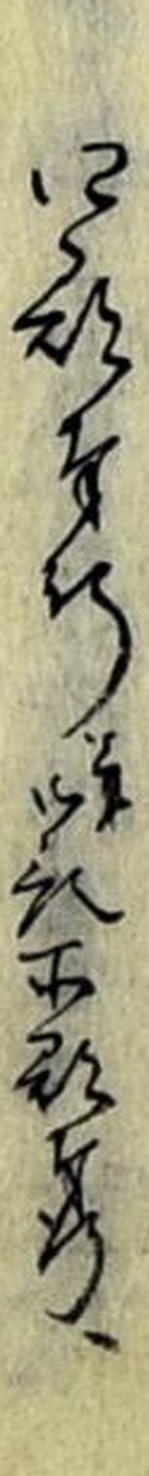四郡奉行并御預所郡奉行へ
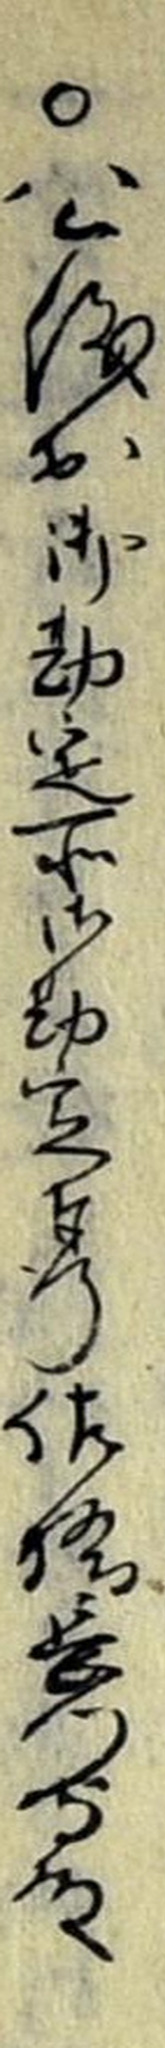〇公儀於御勘定所御勘定奉行佐橋長門守殿
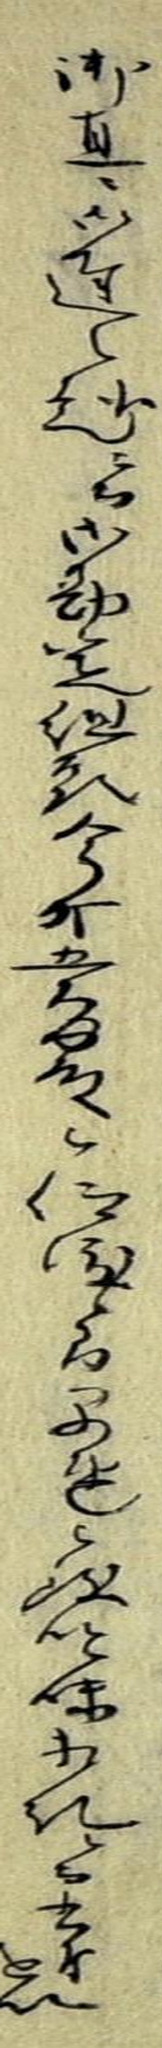御直ニ御達之趣ニ而御勘定組頭今村五右衛門殿被仰渡候間早速被致吟味相糺ニ而書付を以

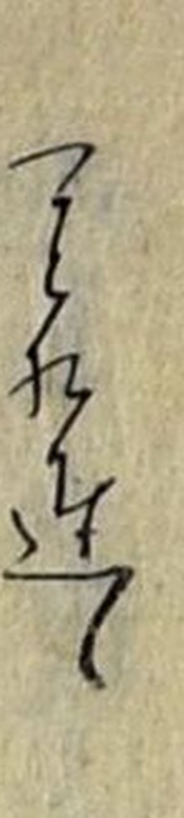可被相達候
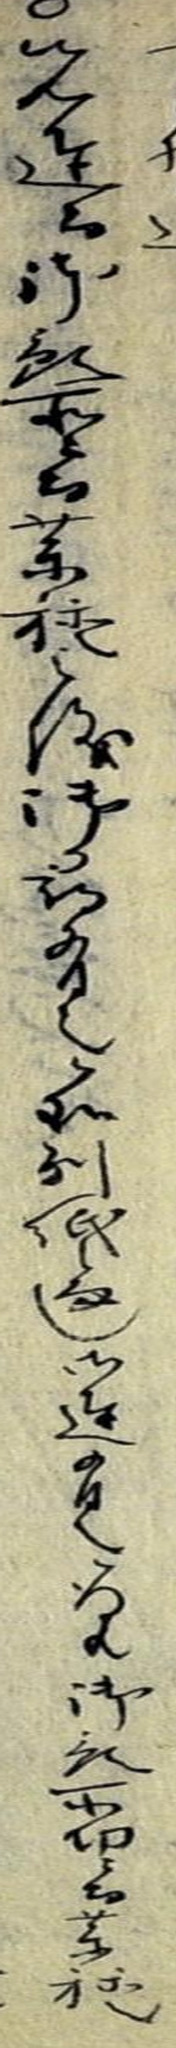〇先達而御預所ニ而薬種之儀御尋有之候処別紙之通御達有之候得共御預所切ニ而薬種
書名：命令之部 三
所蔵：福井県文書館 Fukui Prefectural Archives
